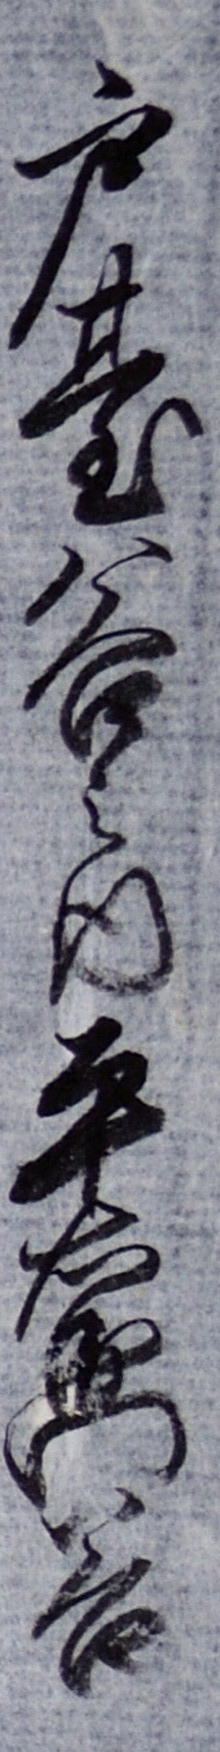戸臺谷之内平右衛門谷
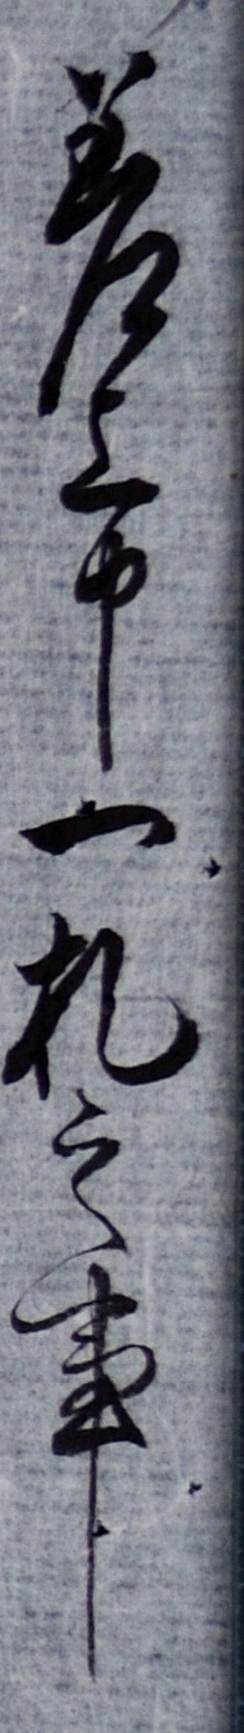差上申一札之事
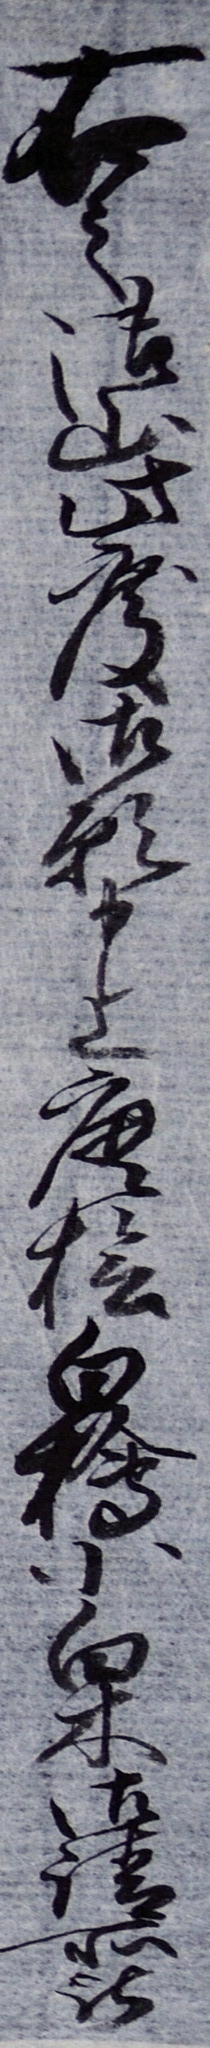右之御山此度御願申上唐松白檜小杲御請所
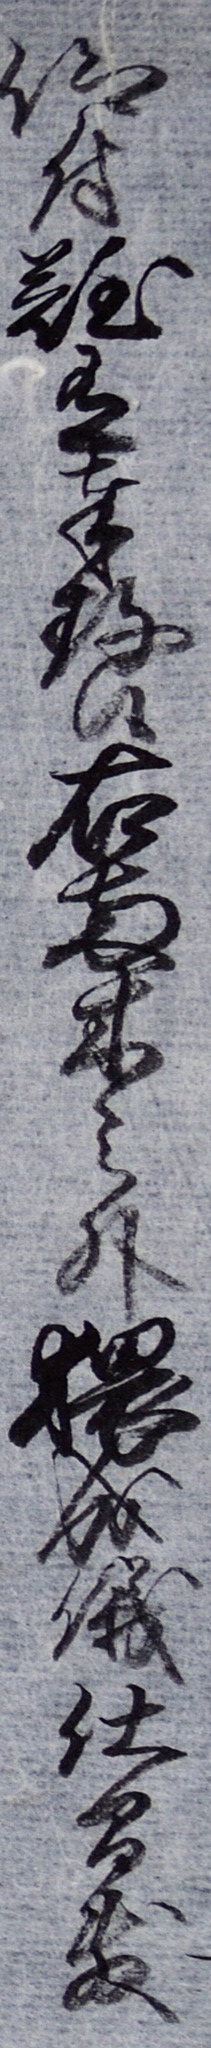仰付難有奉存候右両木之外猥成儀仕間敷
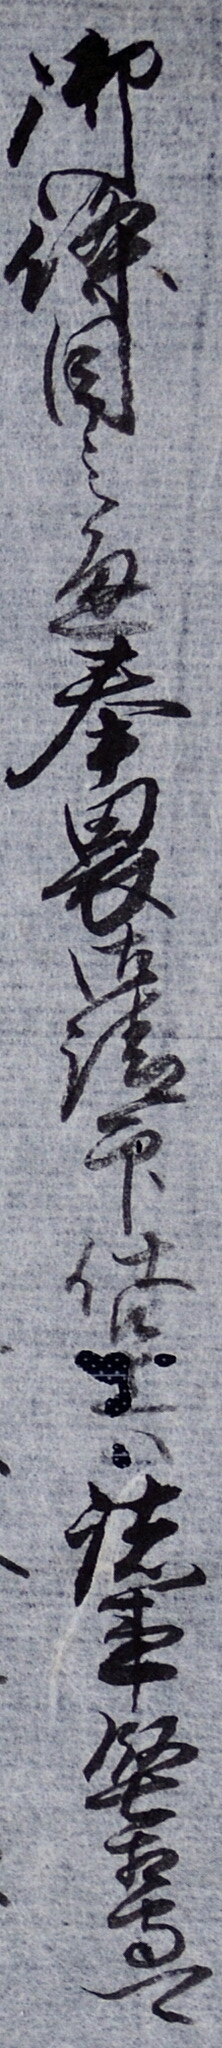御条目之通奉畏御請印仕候上ㇵ諸事堅相守可
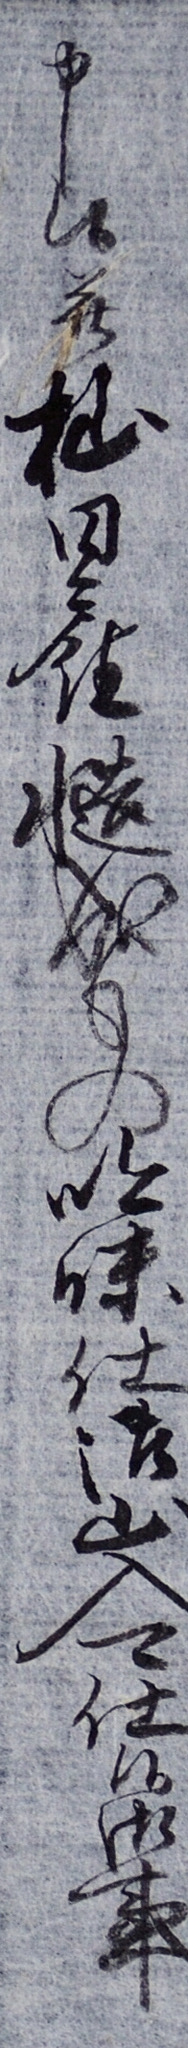申候幷杣日雇慥成もの吟味仕御山入可仕候御事
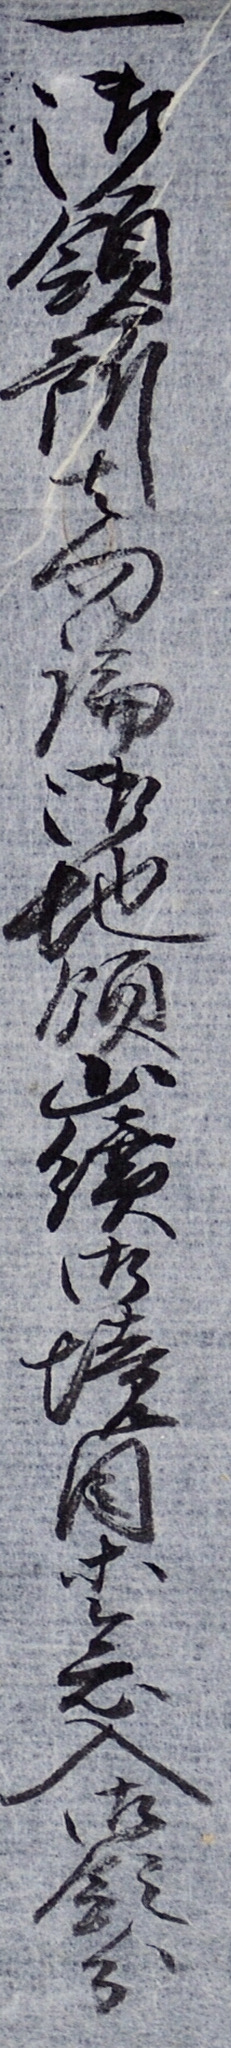一御領所者勿論御地領山續御境目等念入御領分
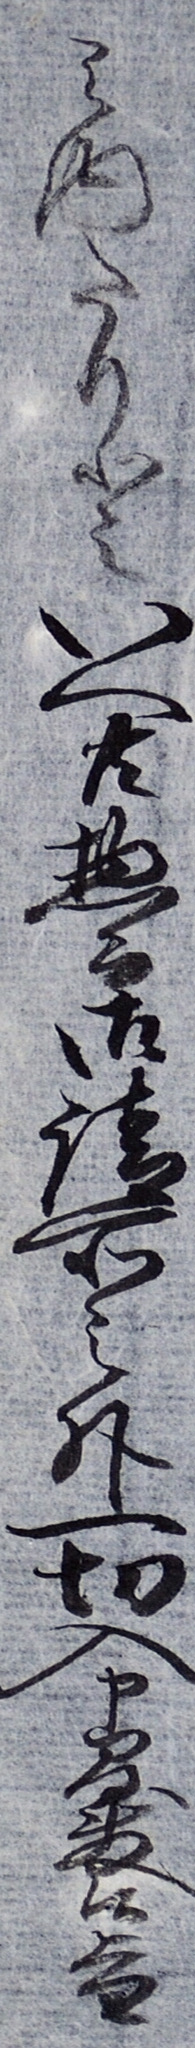之内たり登いへ共惣而御請所之外一切入間敷候旨
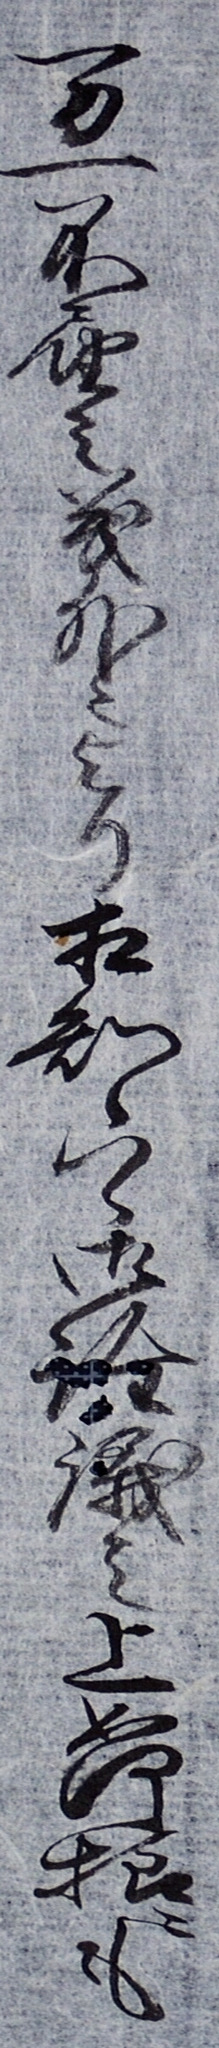万一不届之義外々より相知候ハハ御詮議之上如何様にも
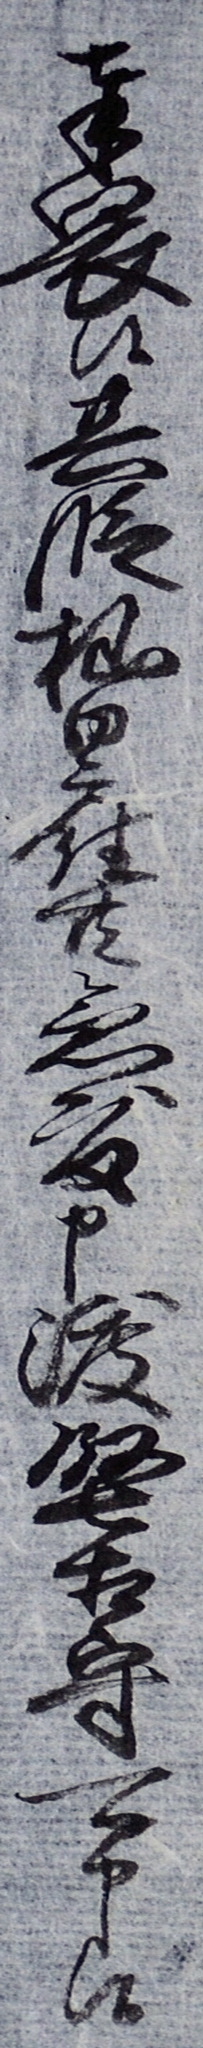奉畏候其段杣日雇共急度申渡堅相守可申候
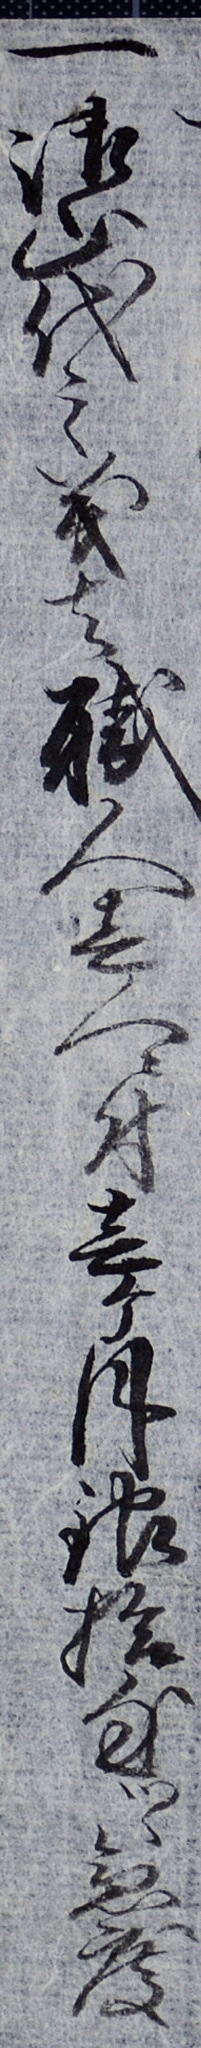一御山伐之者職人壱人ニ付壱ヶ月銀拾匁ツ〃急度
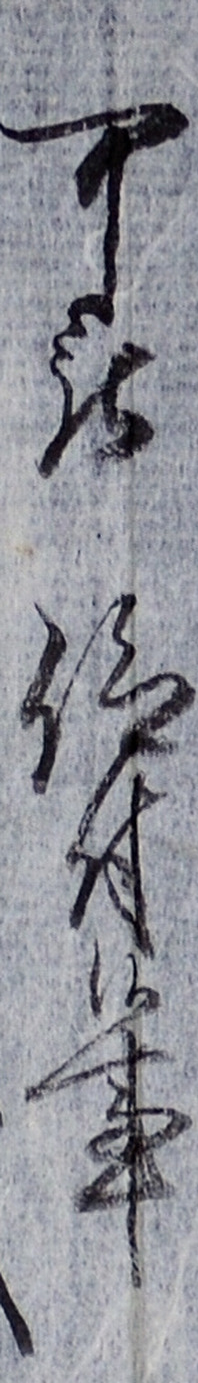可被仰付候事
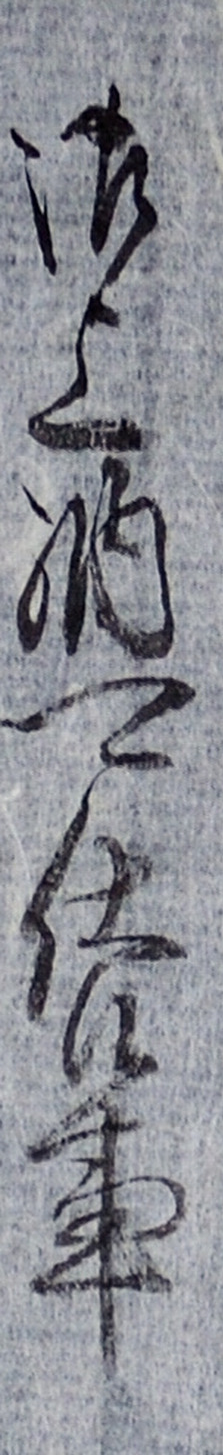御上納可仕候事
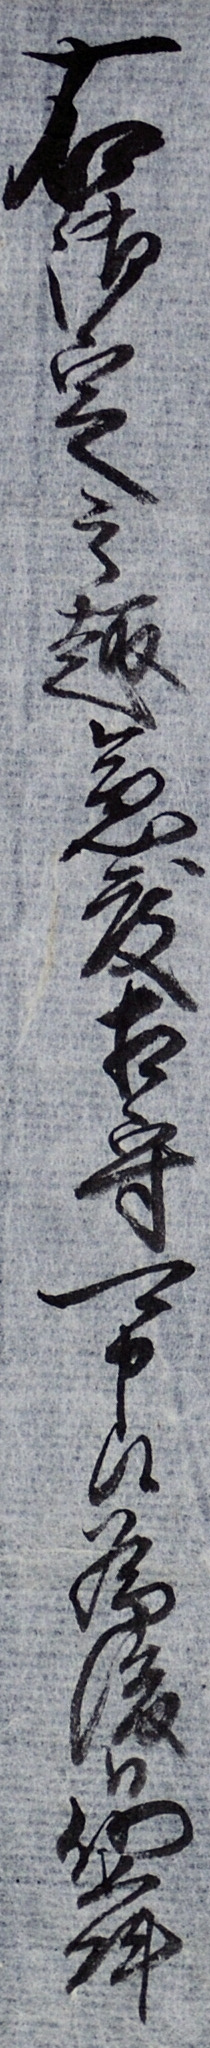右御定之趣急度相守可申候為後日仍如件
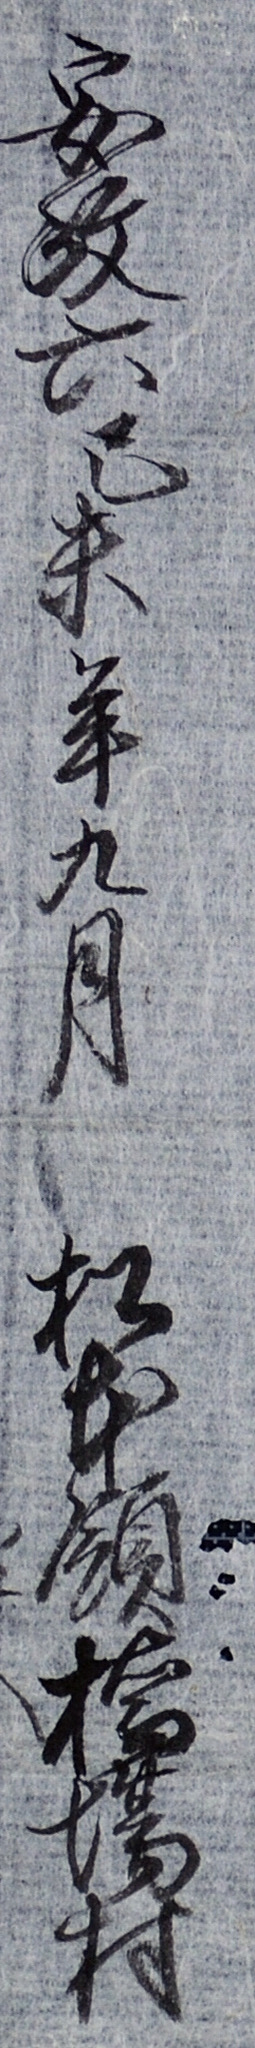安政六己未年九月松本領橋場村
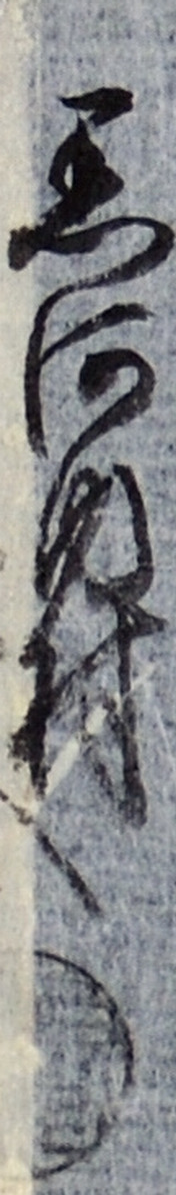黒河内村
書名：差上申一札之事
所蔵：伊那市立高遠町図書館・合同会社AMANE
